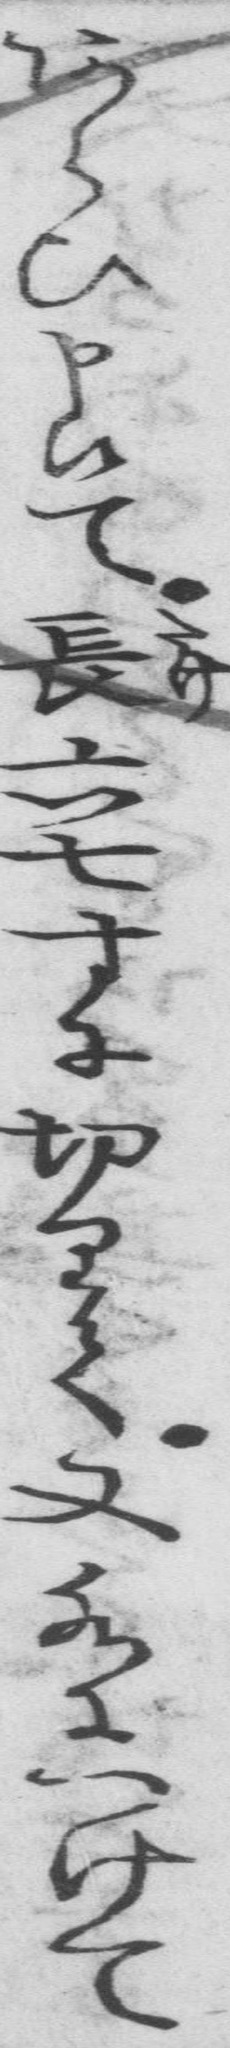あらひ申候て。長六七寸に切りて。又水につけて
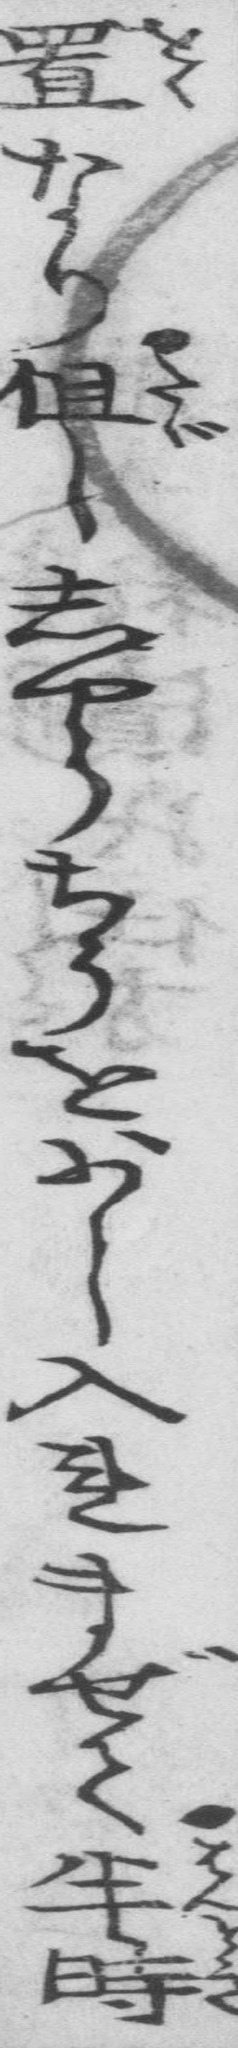置なり。但ししやうちうを少し入れまぜて。半時
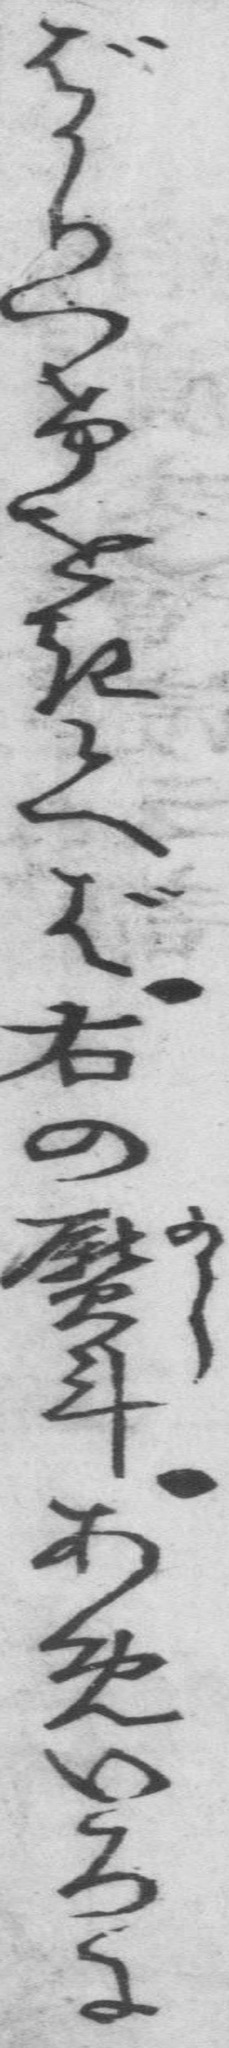ばかりいけをき候へば。右の熨斗。あめいろに
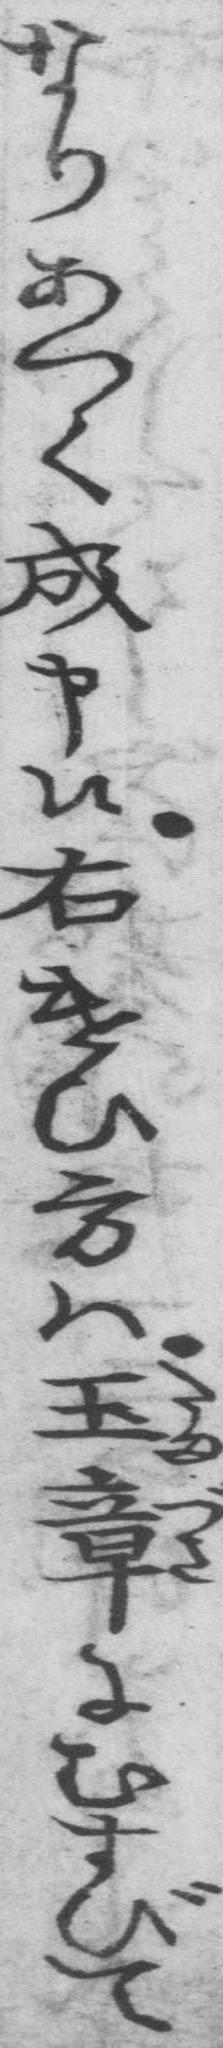なりあつく成申候。右遣ひ方は。玉章にむすびて
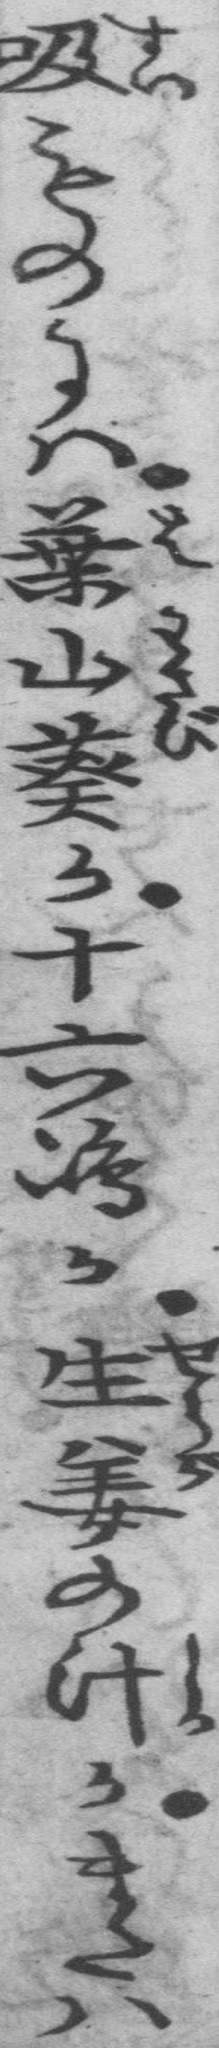吸ものには。葉山葵か。十六島か。生姜の汁か。または

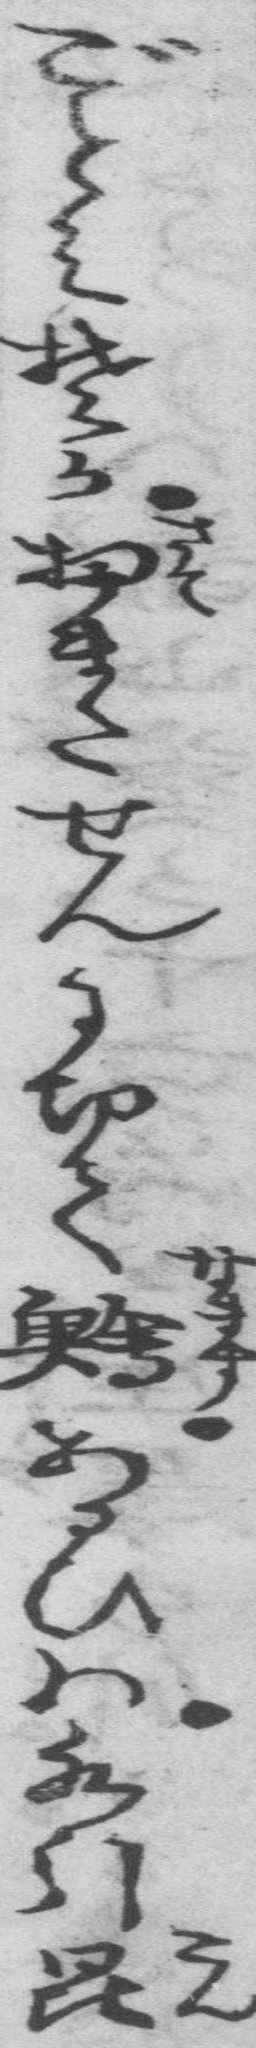ごとみそか。扨またせんに切て鱠。あわひは。水引昆
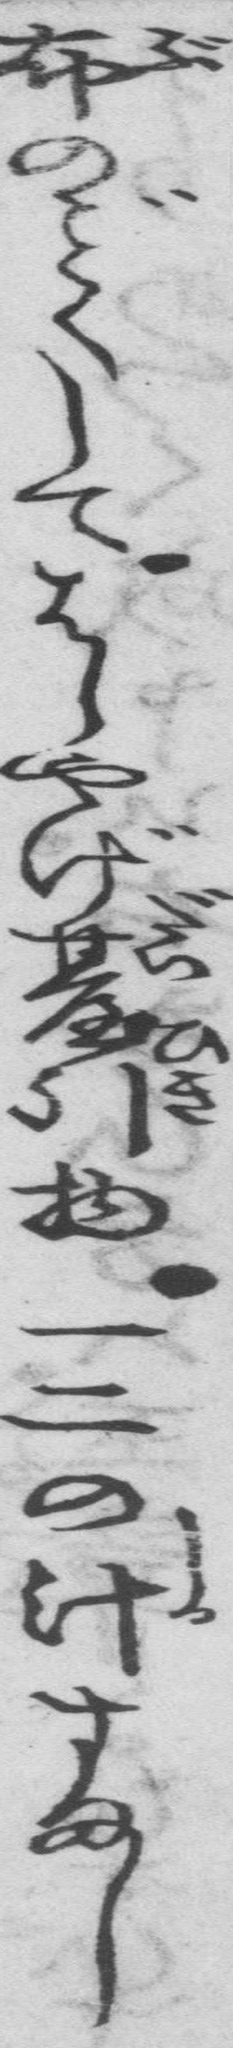布のごとくして。はしやげ台引物。一二の汁すまし
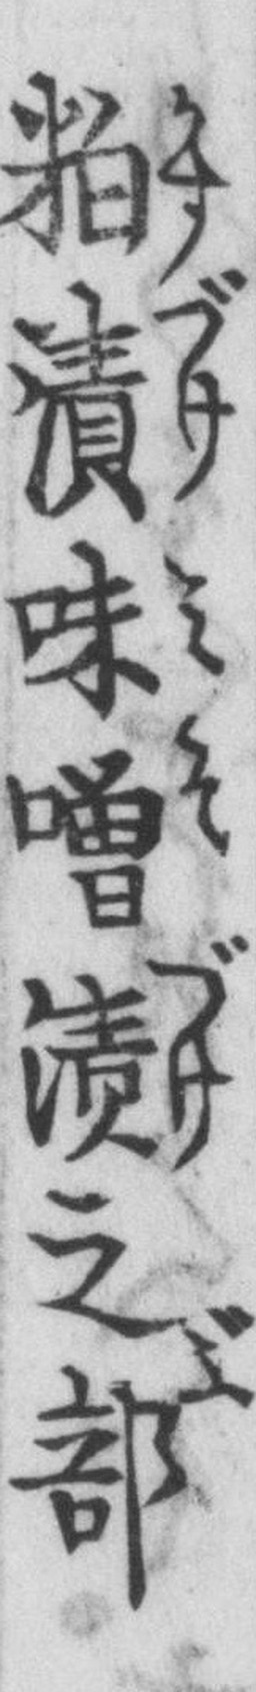粕漬味噌漬之部
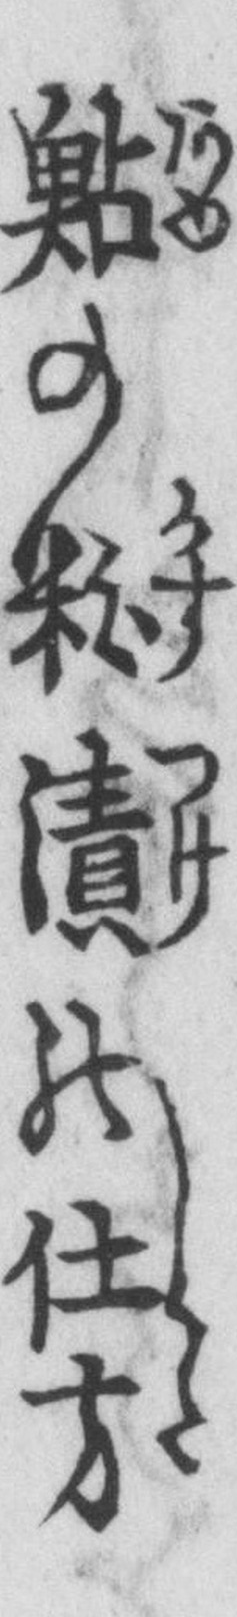鮎の粕漬の仕方
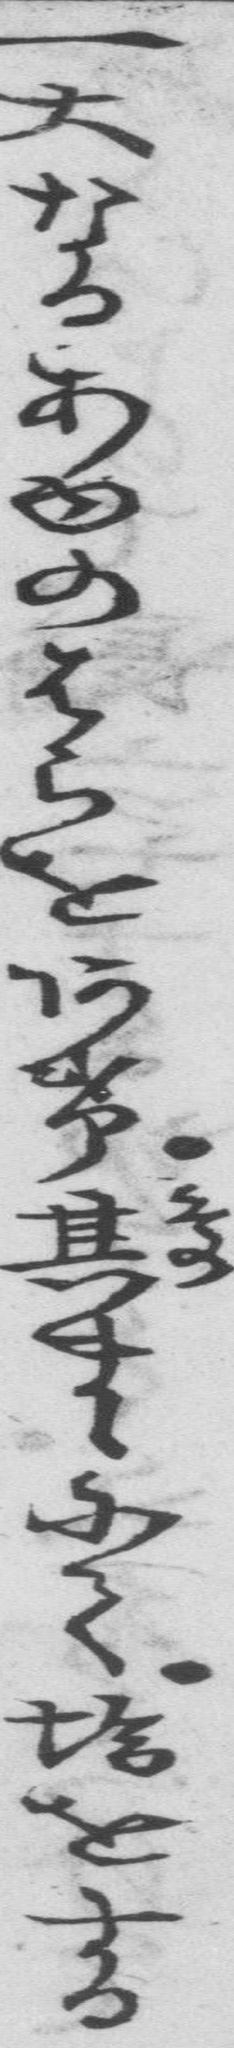一大なるあゆのはらをあけ。其まゝにて。塩をする
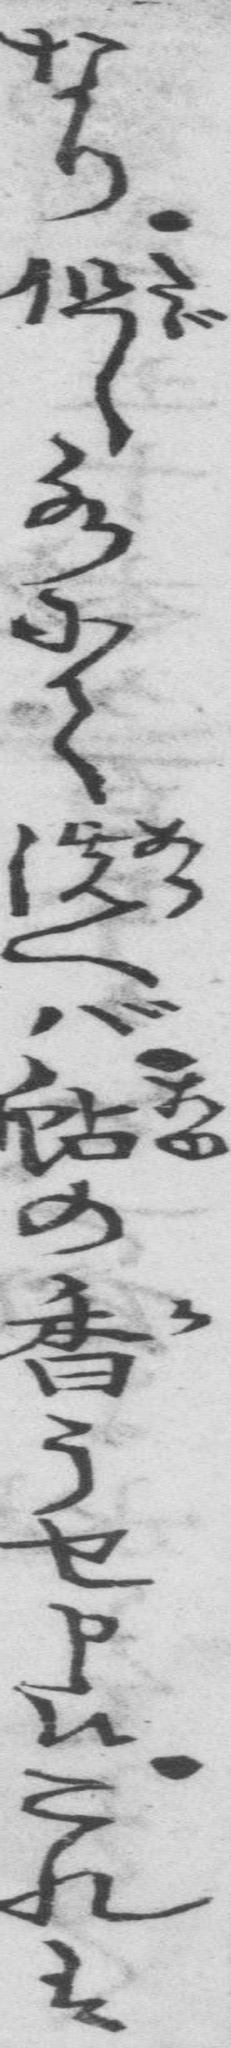なり。但し水にて洗へば。鮎の香うせ申候。これも
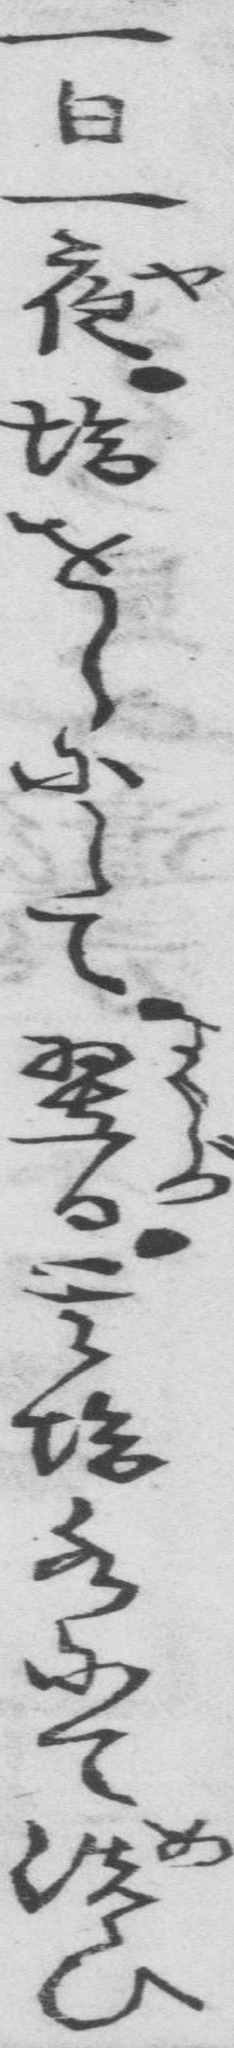一日一夜。塩をしにして。翌日。其塩水にて。洗らひ
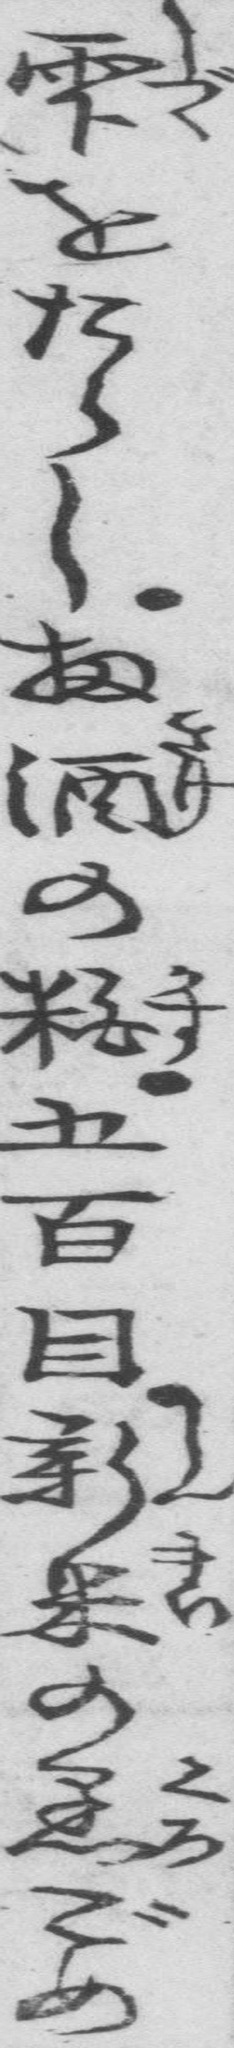雫をたらし。扨酒の粕。五百目。新米の黒ごめ
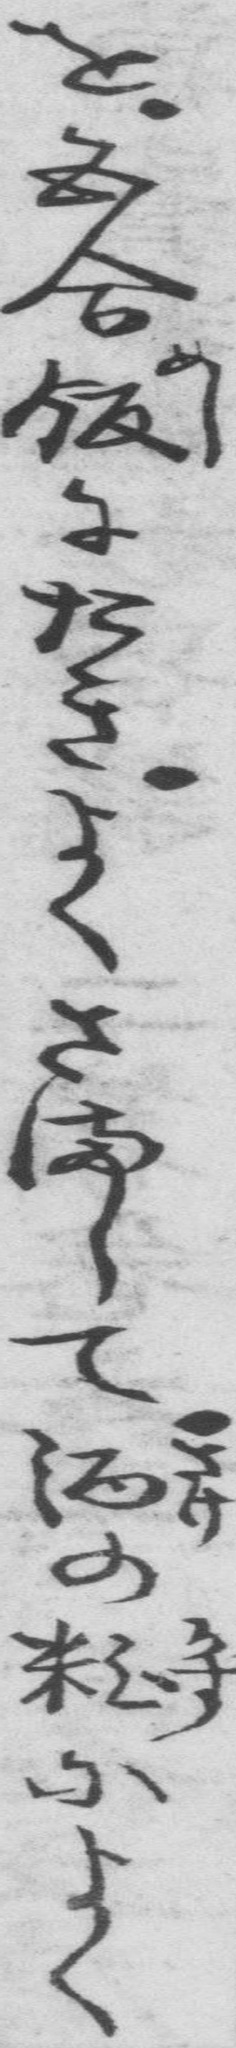を。五合飯にたき。よくさまして。酒の粕によく
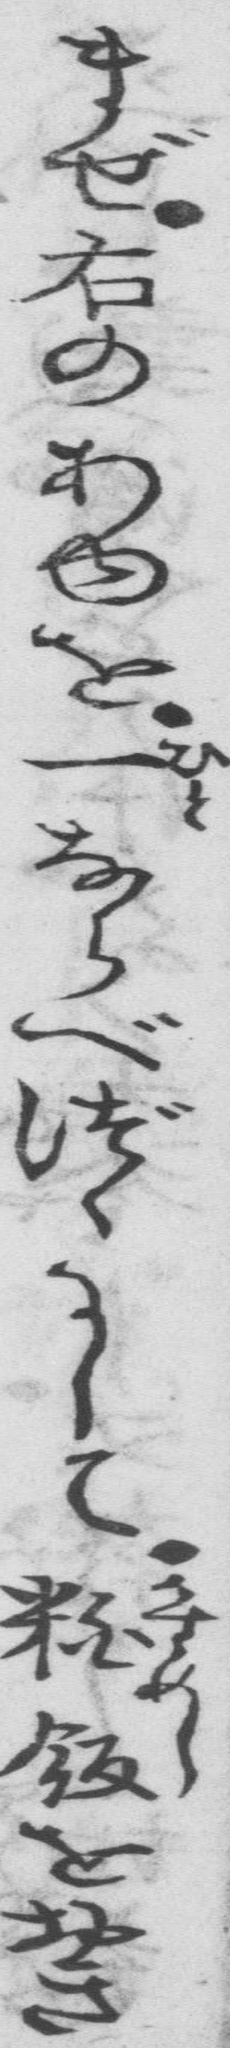まぜ。右のあゆを。一ならべづゝにして。粕飯をおき
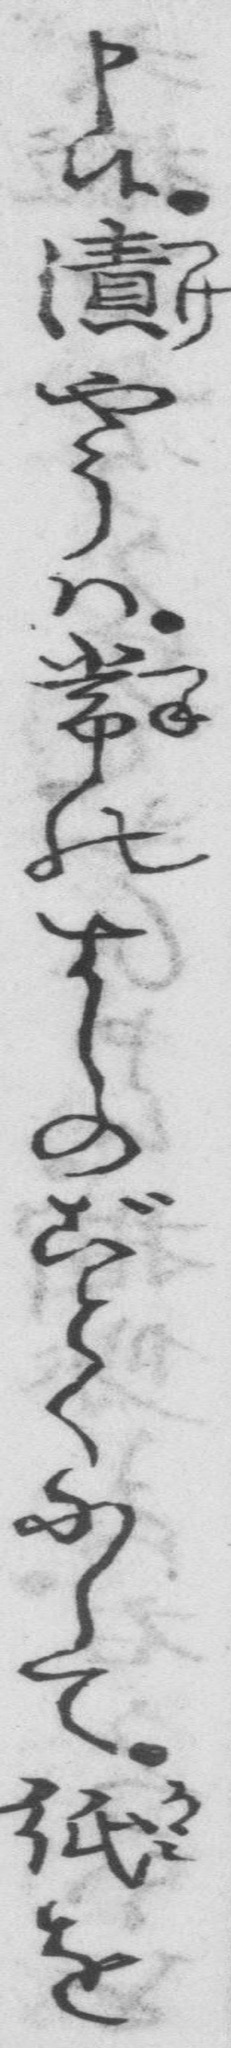申候。漬やうは。常のすしのごとくにして。紙を
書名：萬寳料理秘密箱
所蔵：大阪府立大学学術情報センター 国文学研究資料館
